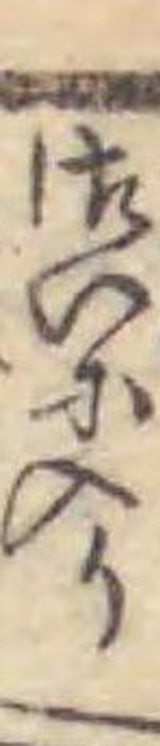御いに入り
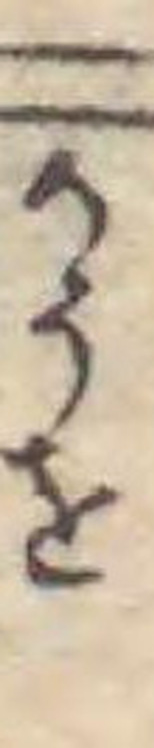かうを
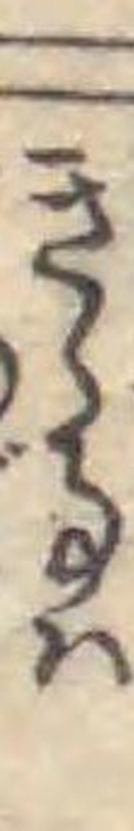きく事は
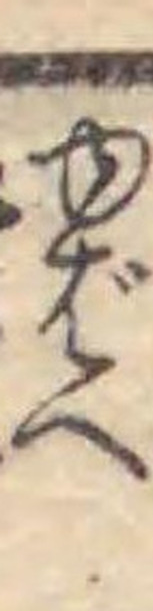ゆばへ
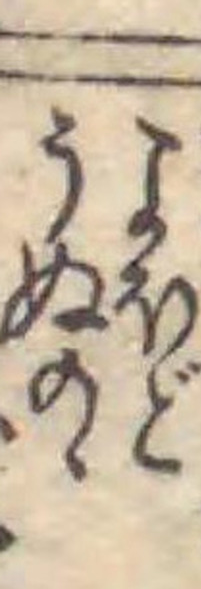うぬのゝ
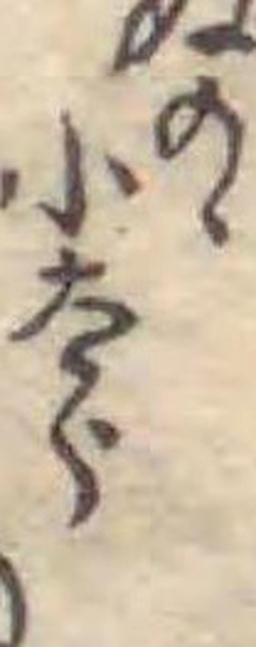小太郎
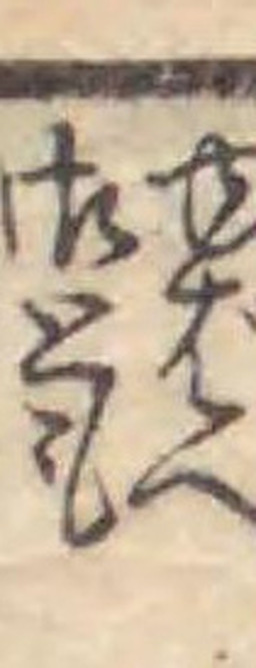御とも
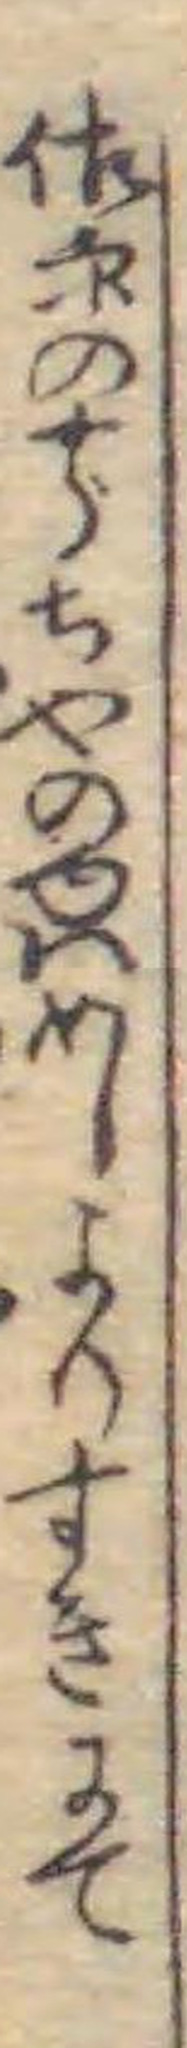佐原の十郎ちやのゆはめしよりすきにて
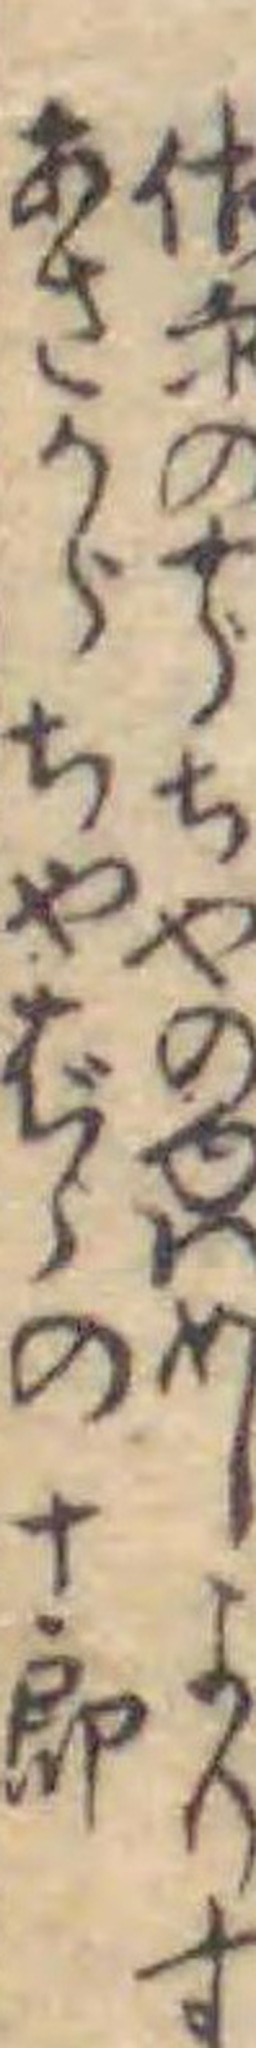あさからちやばらの十郎

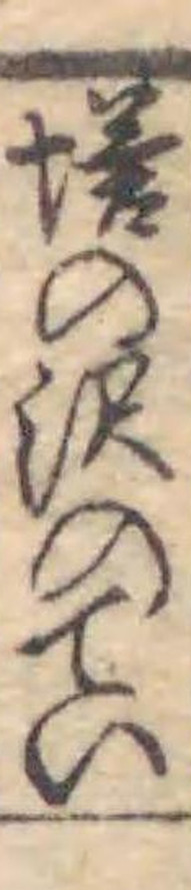蟻の沢のてい
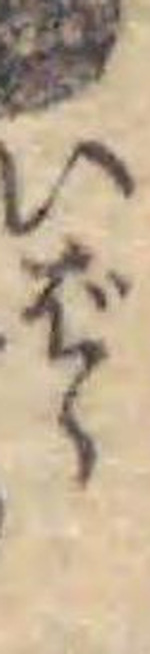いばら
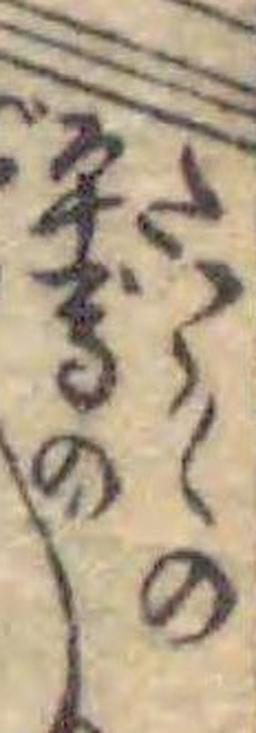平馬の
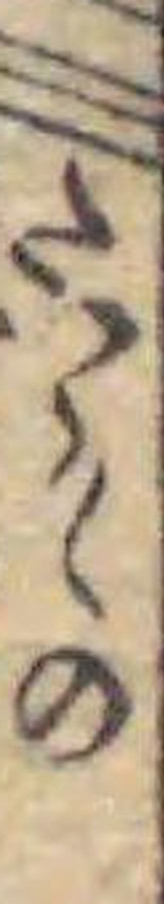たいらくの
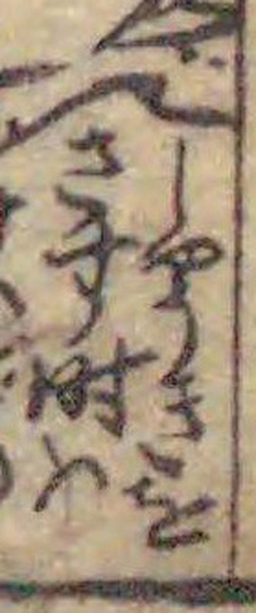さす時は
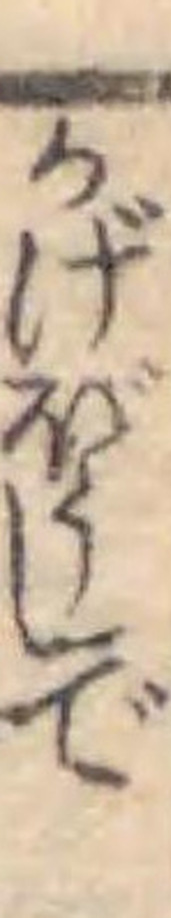かげぼうしで
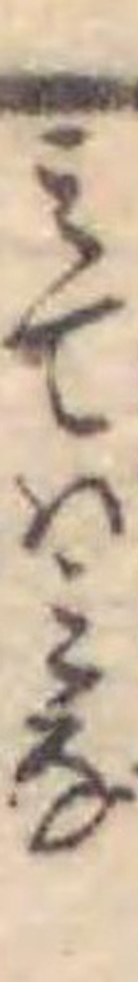みてはみな
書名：文武二道万石通 : 3巻
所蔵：国立国会図書館 National Diet Library, JAPAN
